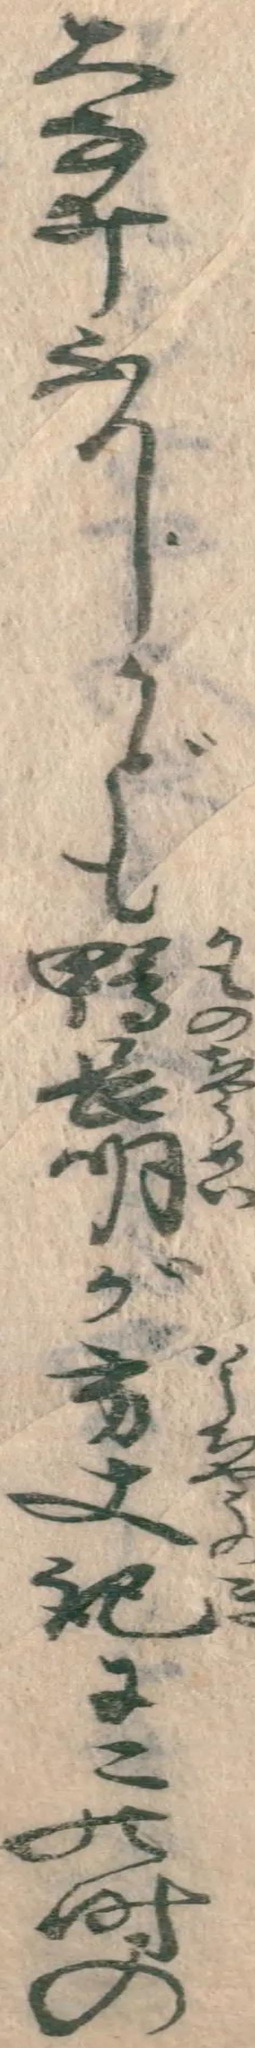大なゐふりしかども鴨長明が方丈記にこの時の
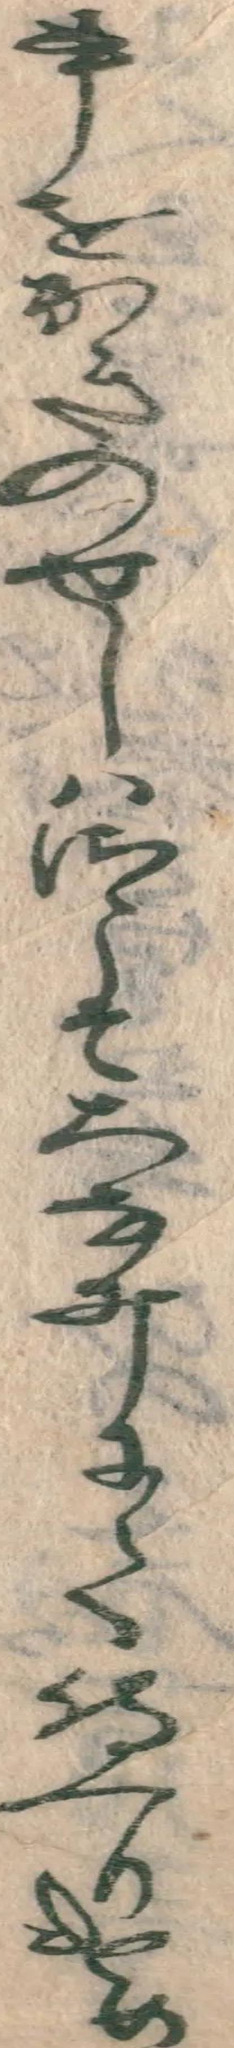事をかきのせしはさこそ大なゐにて侍へりけめ
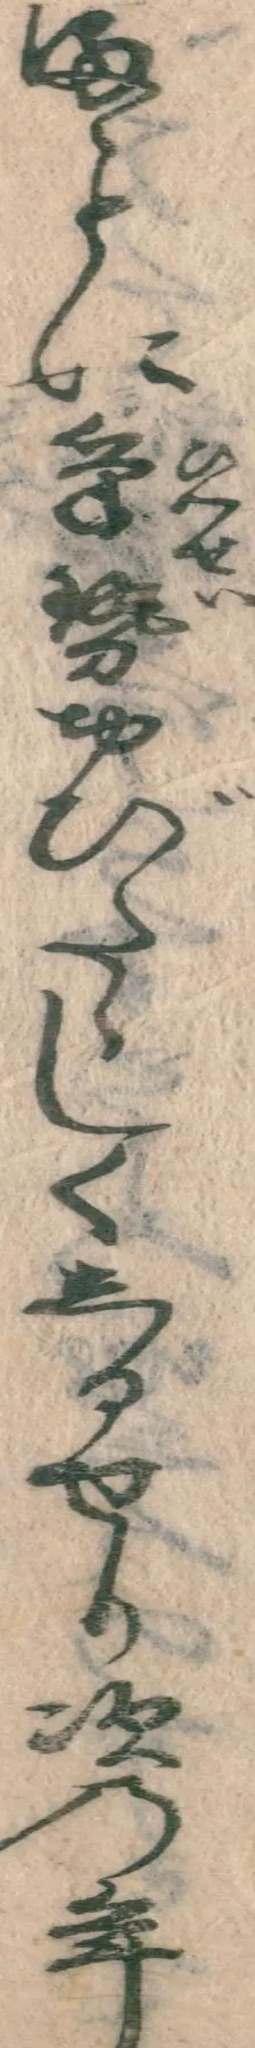まことに筆勢おびたゝしくしるせり次の年
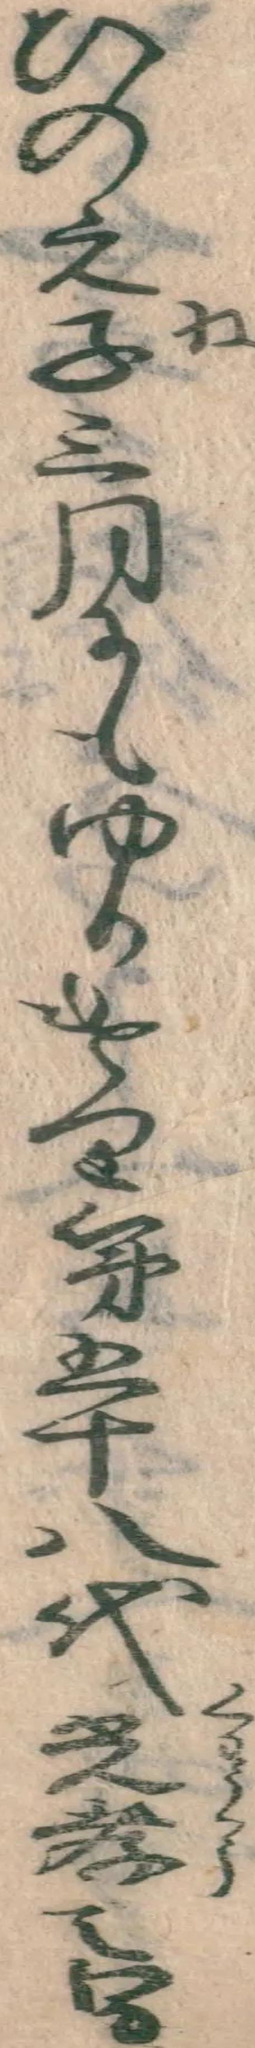ひのえ子三月にもゆりけり第五十八代光孝天皇
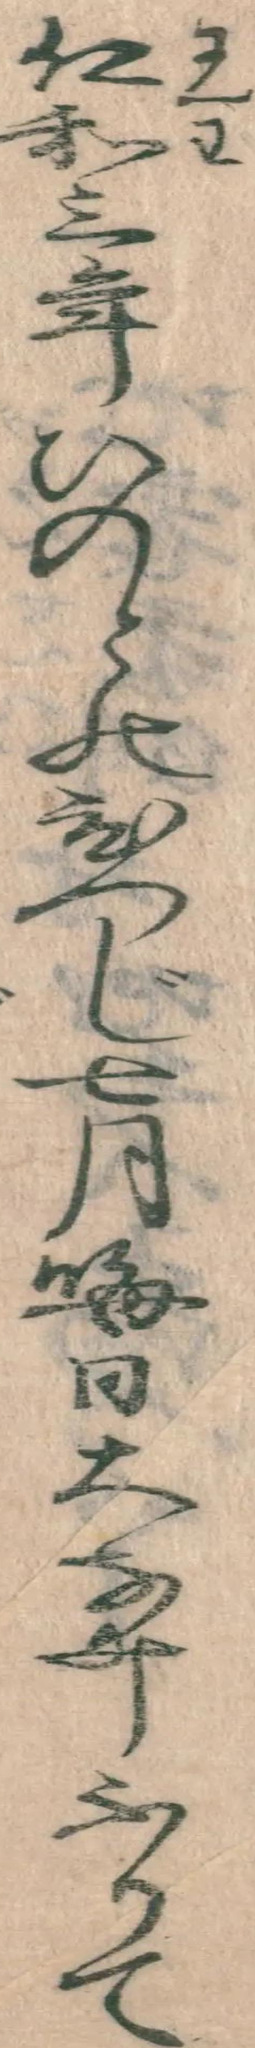仁和三年ひのとのひつじ七月晦日大なゐふりて
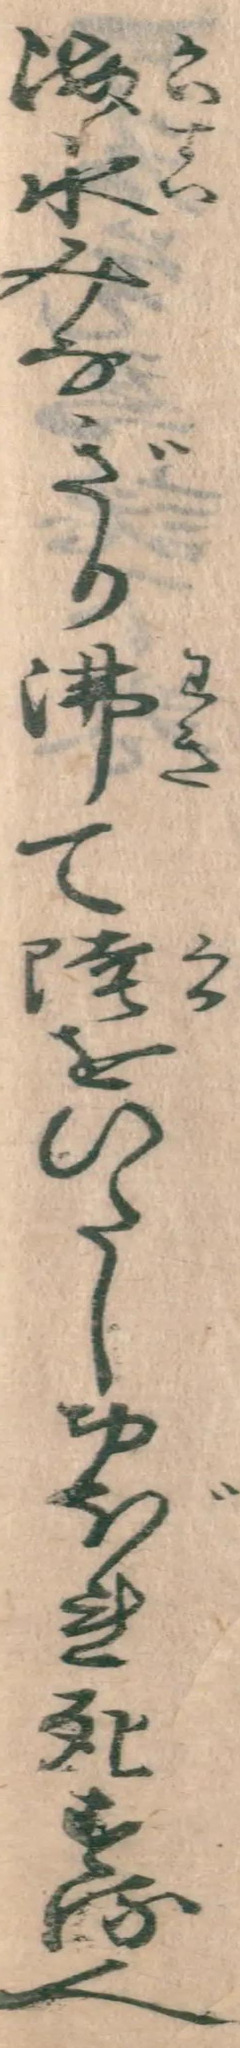海水みなぎり沸て陸をひたしおぼれ死する人
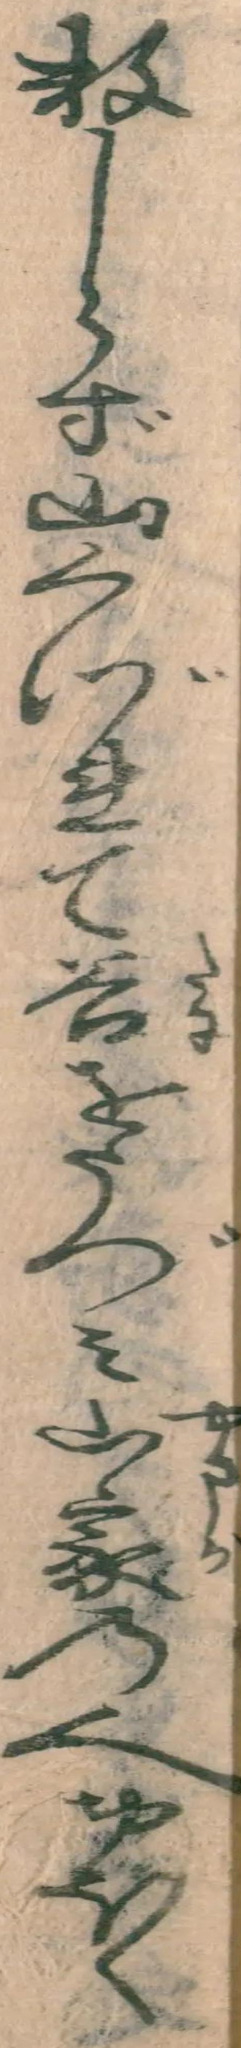数しらず山くづれて谷をうづみ山家の人おほく
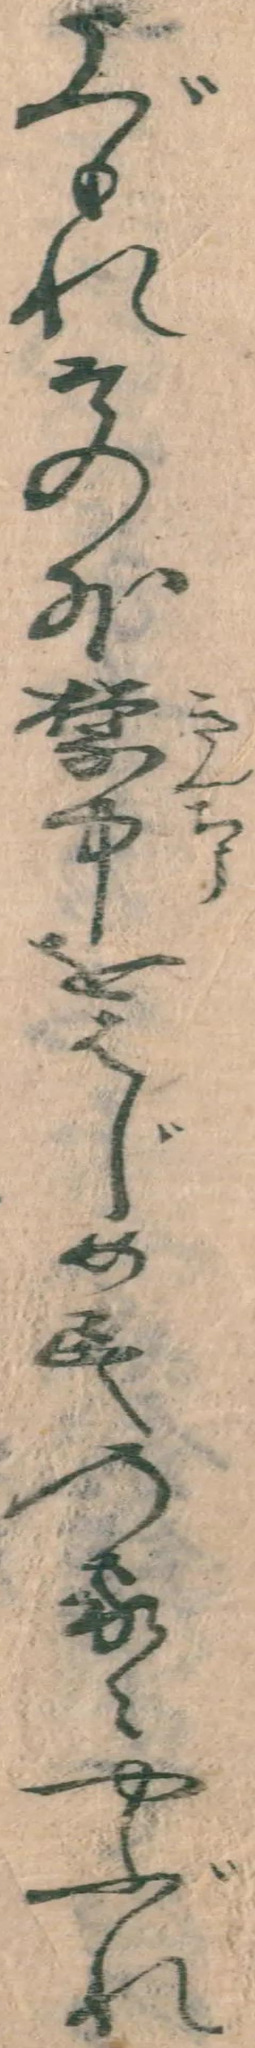うづもれその外禁中をはじめ民の家々やぶれ
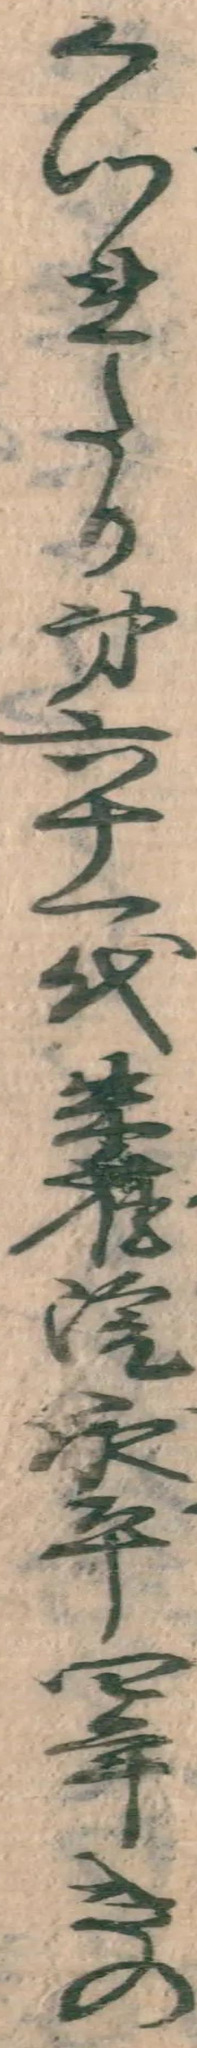くづれたり第六十一代朱雀院承平四年きの
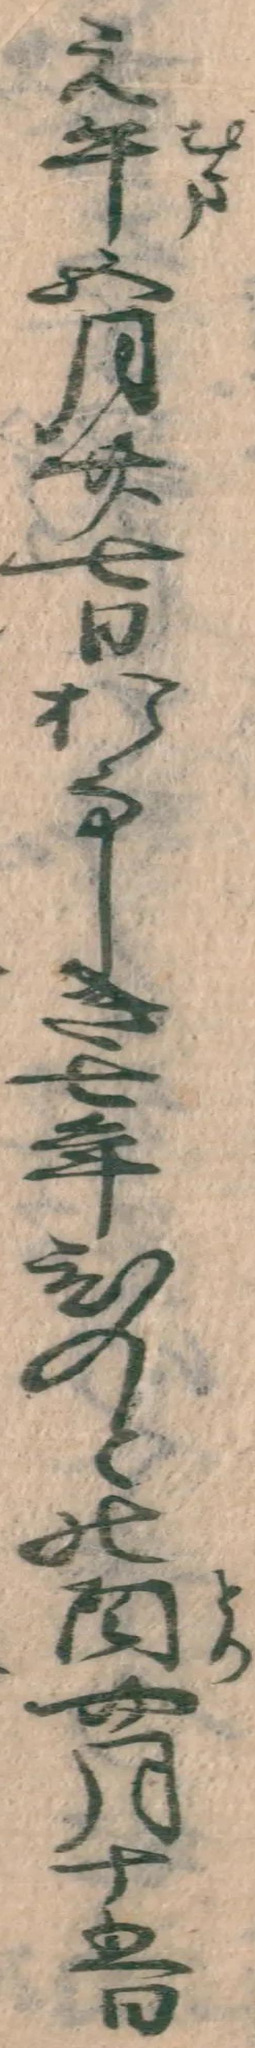え午五月廿七日おなしき七年ひのとの酉四月十五日
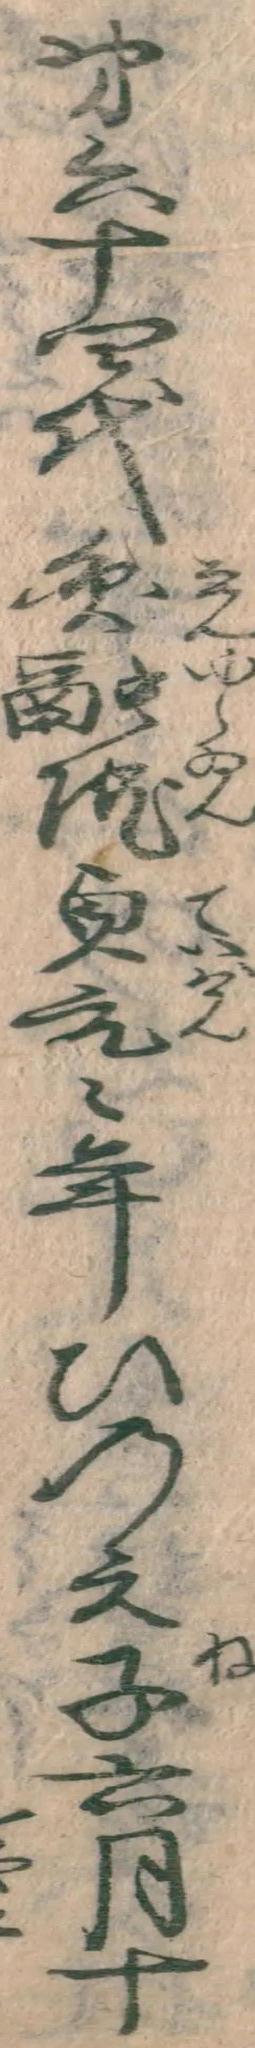第六十四代円融院貞元二年ひのえ子六月十
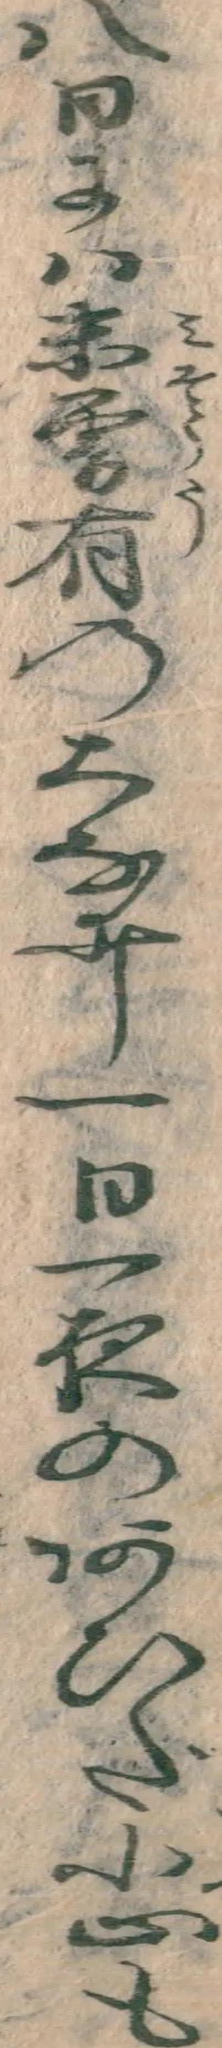八日には未曾有の大なゐ一日一夜のあひた小止も
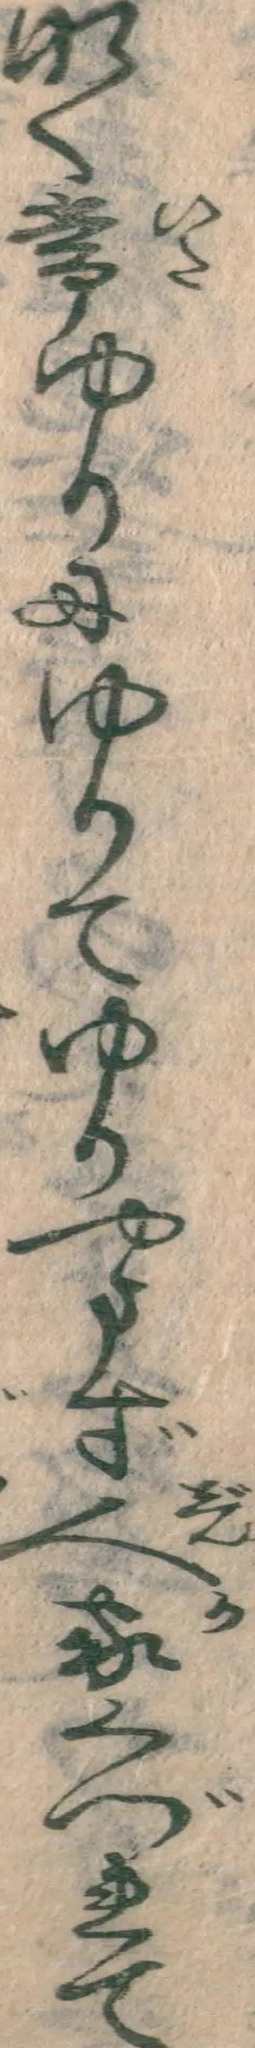なく常ゆりにゆりてゆりやまず人家くづれて
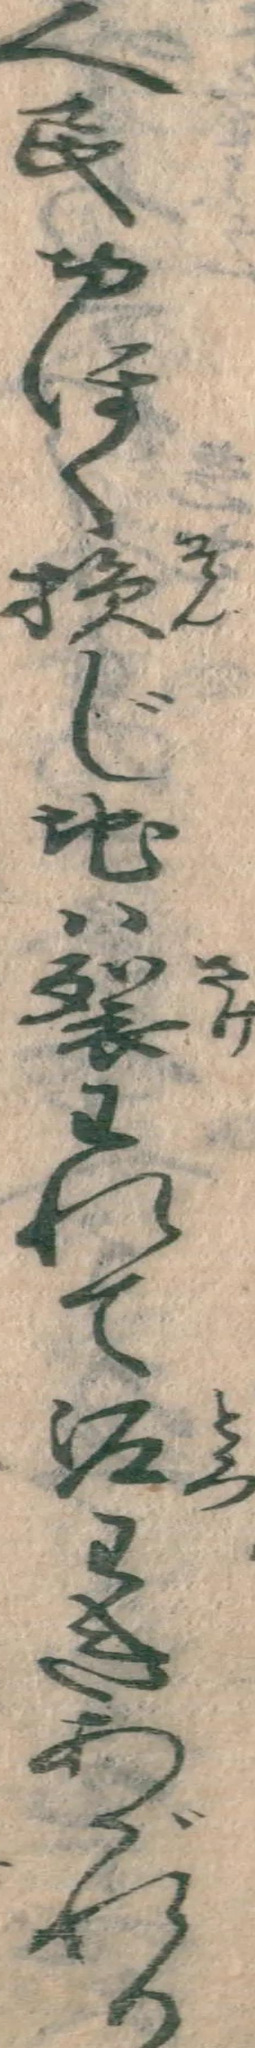人民おほく損じ地は裂われて泥わきあがれり
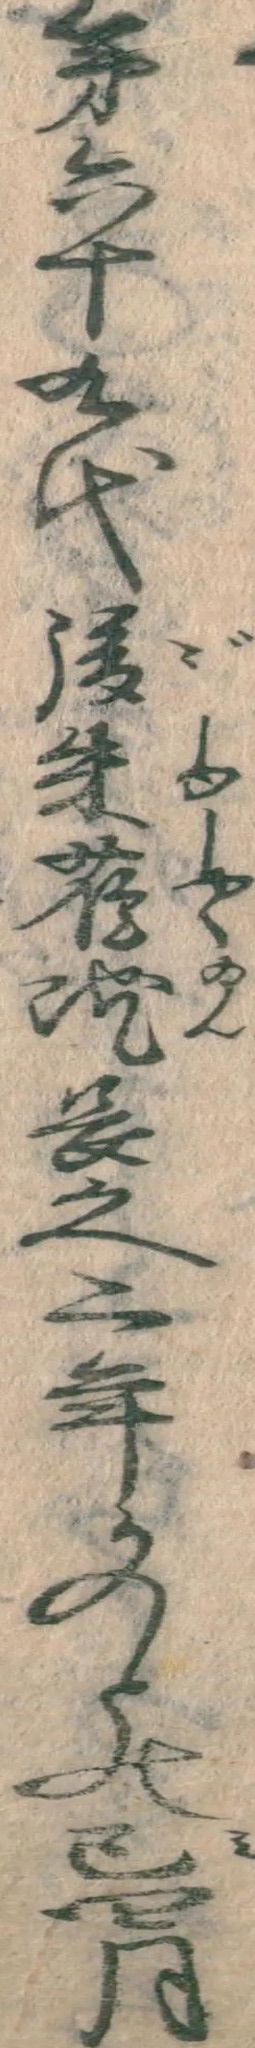第六十九代後朱雀院長久二年かのとの巳四月
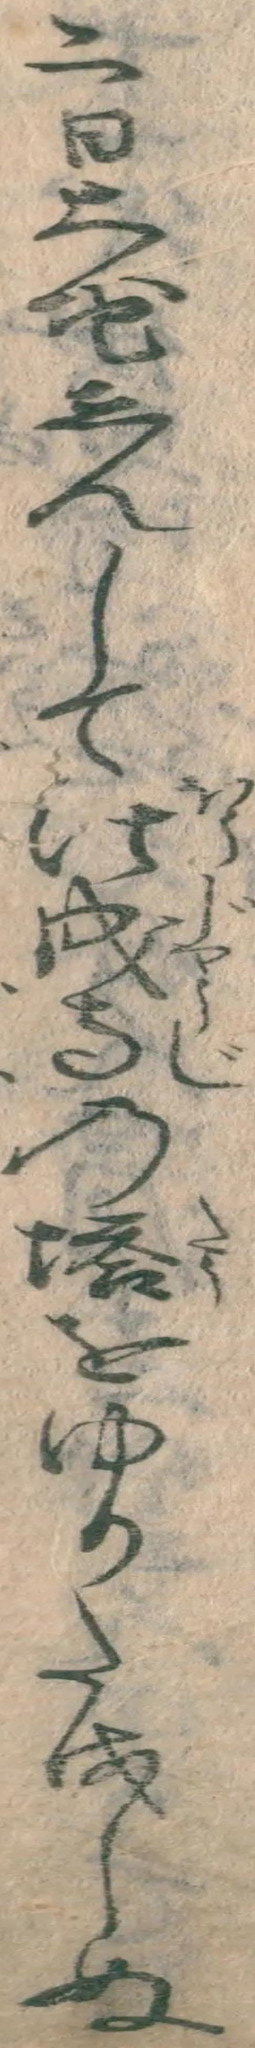二日大地しんして法成寺の塔をゆりたをしぬ
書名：艱難目異志. 上,下
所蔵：国立国会図書館 National Diet Library, JAPAN
